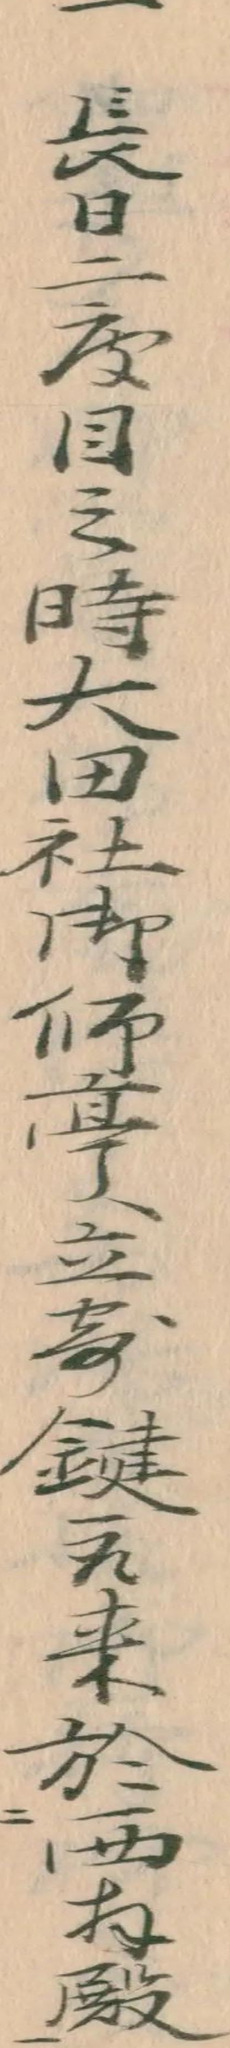一長日二度目之時大田社御師亭へ立寄鍵取来於西拝殿
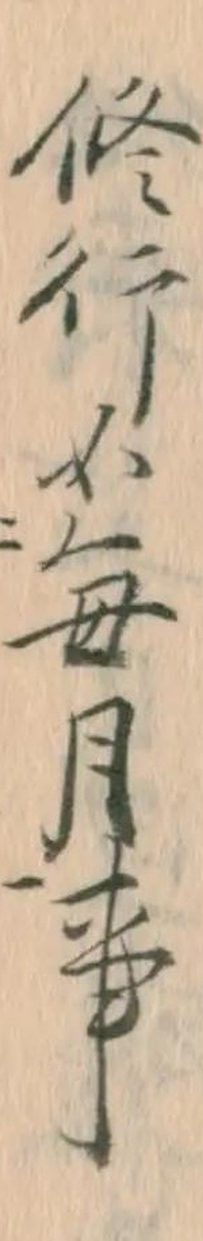修行必毎月事
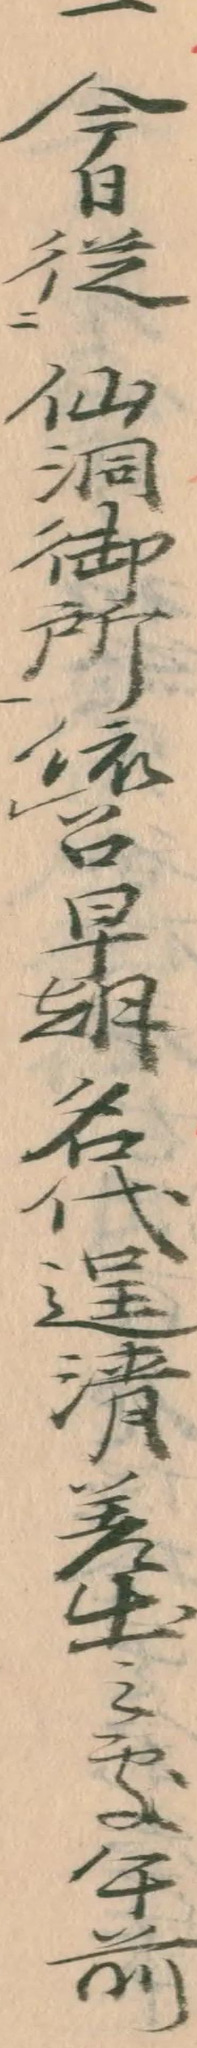一今日従仙洞御所依召早朝名代逞清差出之處午前
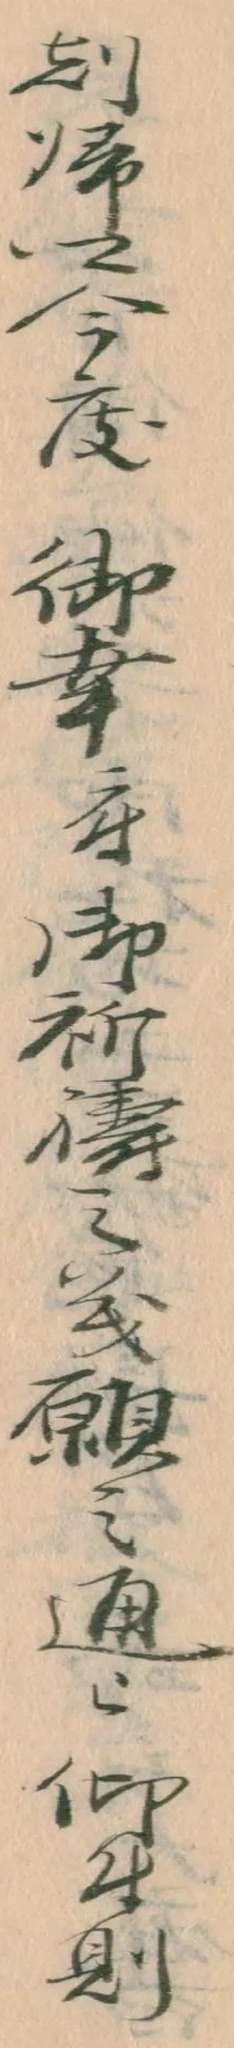刻帰郷今度御幸ニ付御祈祷之義願之通被仰付則
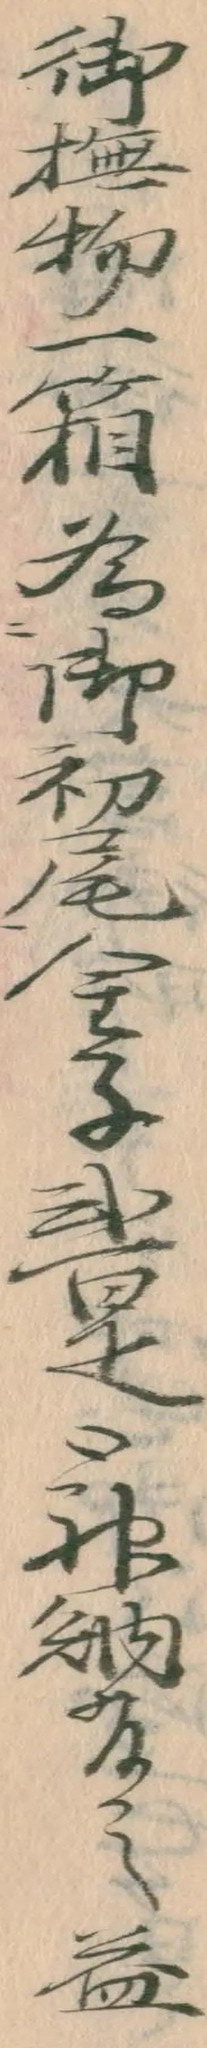御撫物一箱為御初尾金子弐百疋御神納有之益
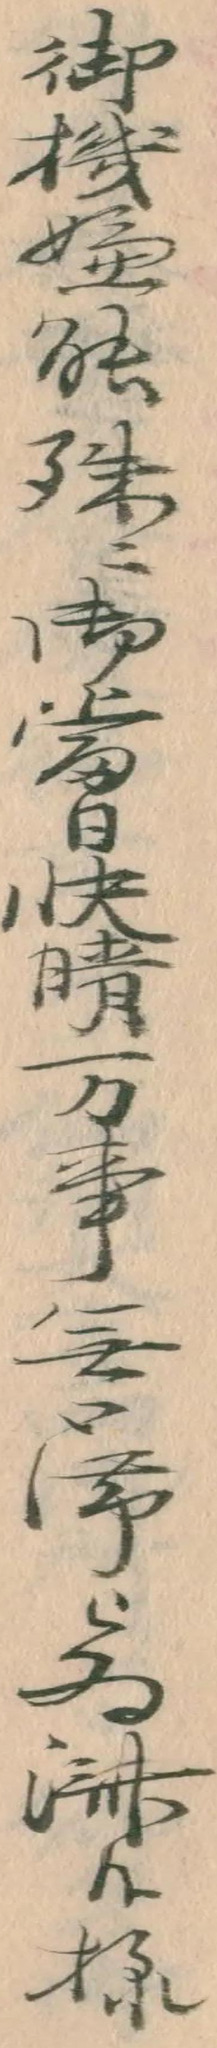御機嫌能殊二御當日快晴万事無御滞被為済候様
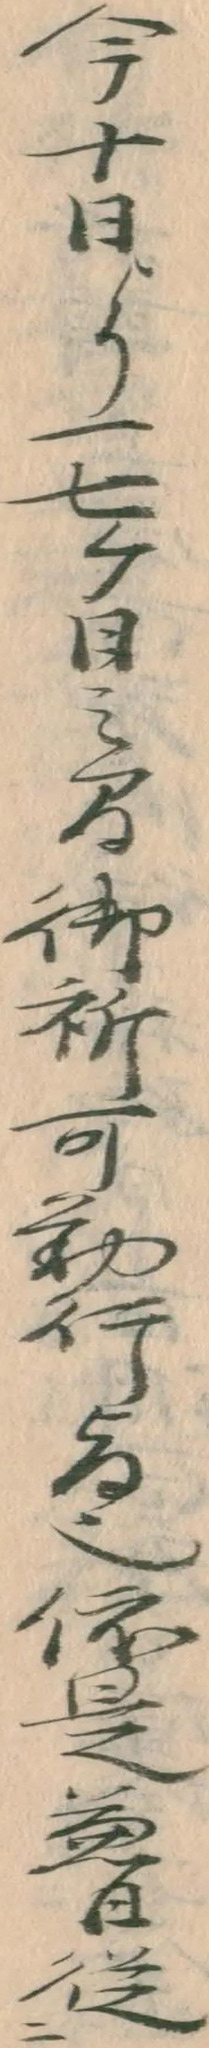今十日より一七ケ日之間御祈可勤行旨也依是兼日従
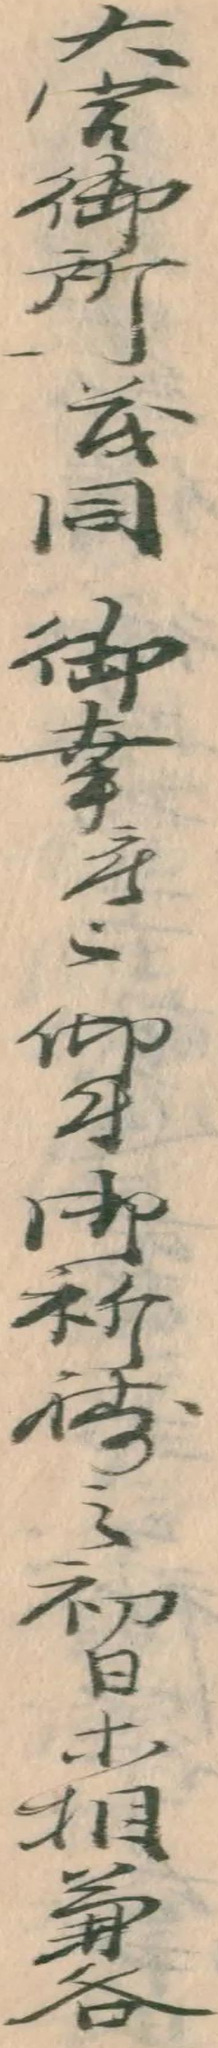大宮御所も同御幸ニ付被仰付御祈祷之初日等相兼各
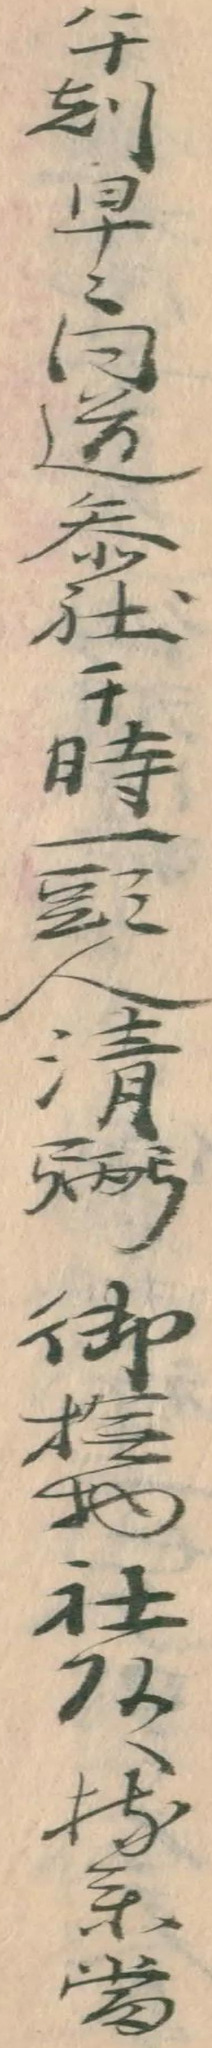午刻早々同道参社于時一頭人清弼御撫物社頭へ持参當
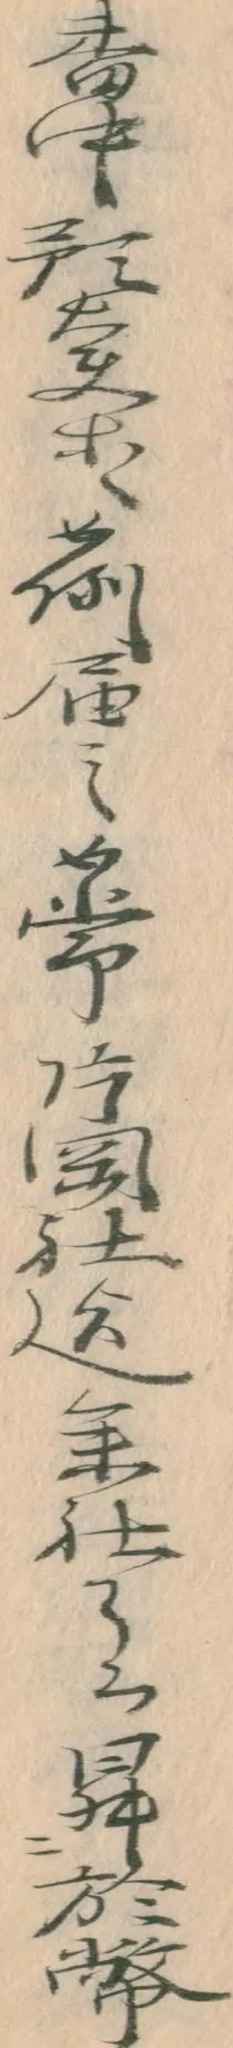番中預大夫等へ如例届之如常片岡社迄参社了而昇於幣
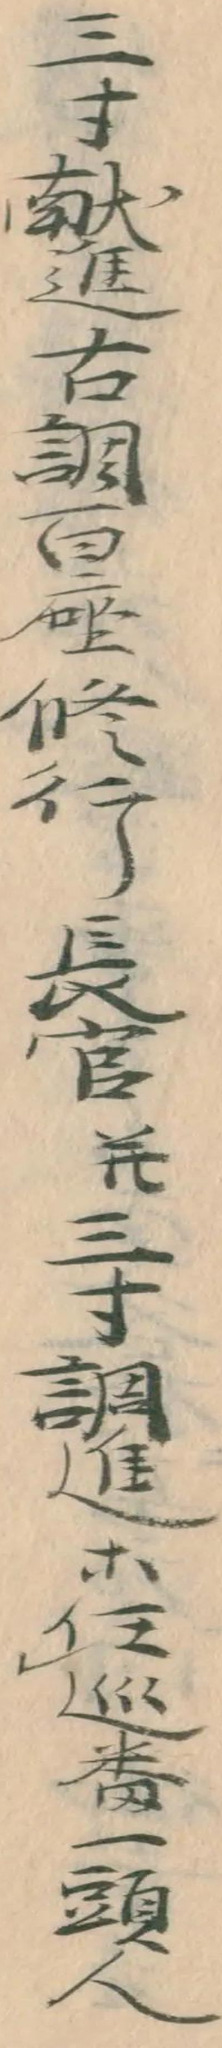三寸献進古調百座修行長官并三寸調進等任巡番一頭人

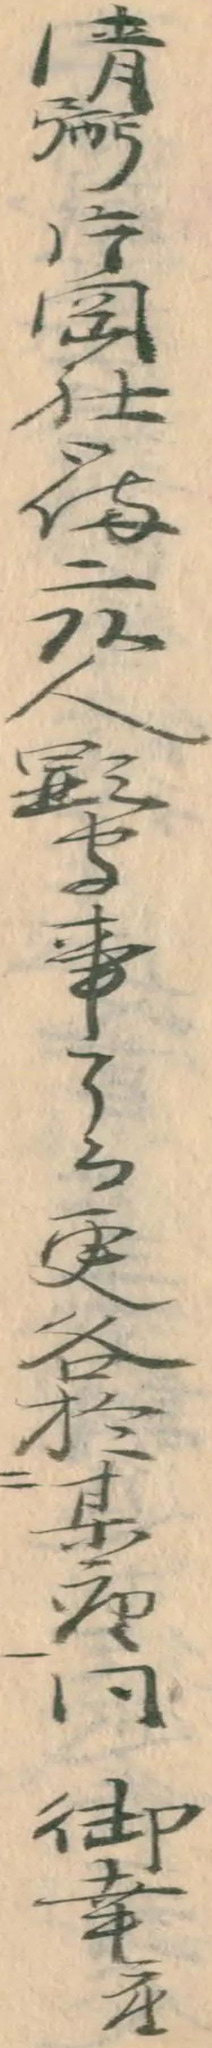清弼片岡社御備二頭人顕守事了而更各於某座同御幸ニ付
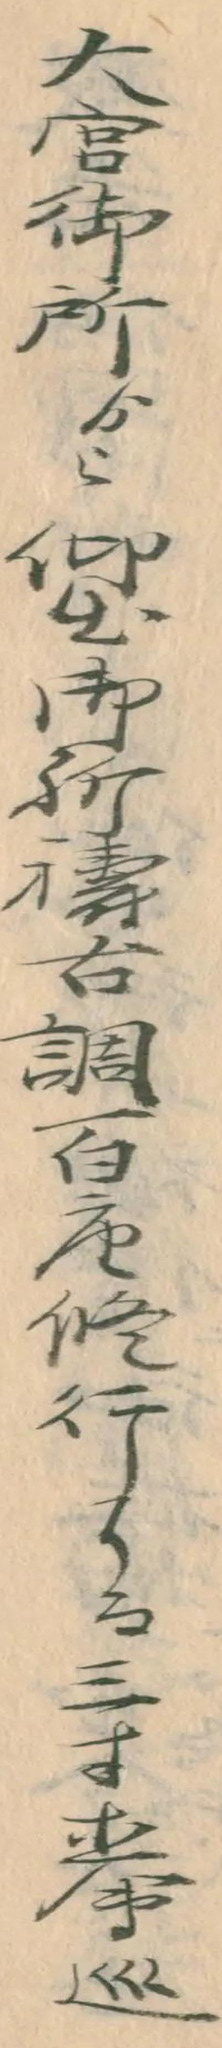大宮御所ゟ被仰出御祈祷古調百座修行了而三寸直會巡
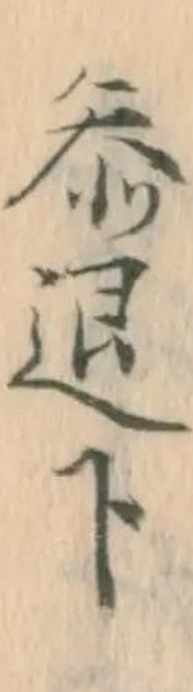参退下
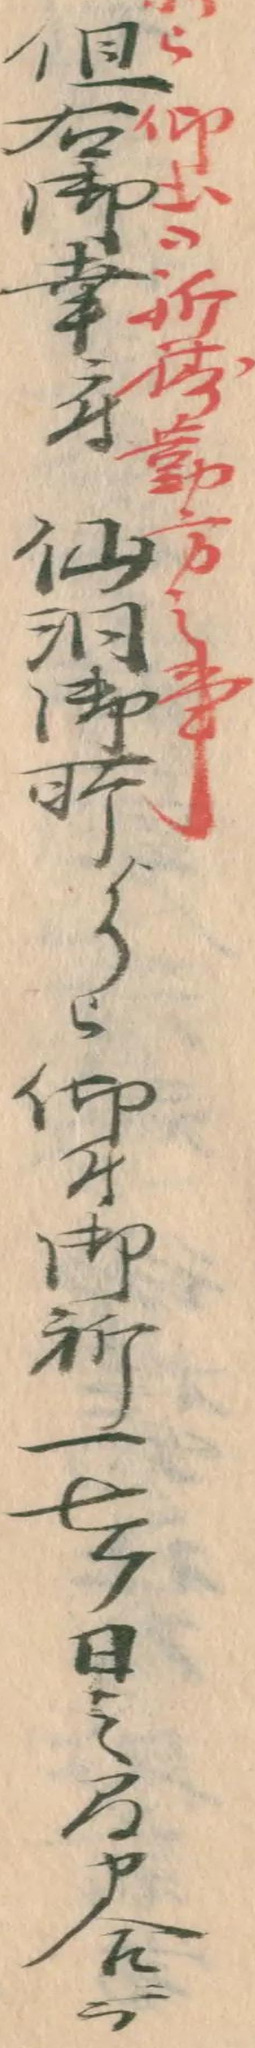但右御幸ニ付仙洞御所より被仰付御祈一七ヶ日之間申合ニ而
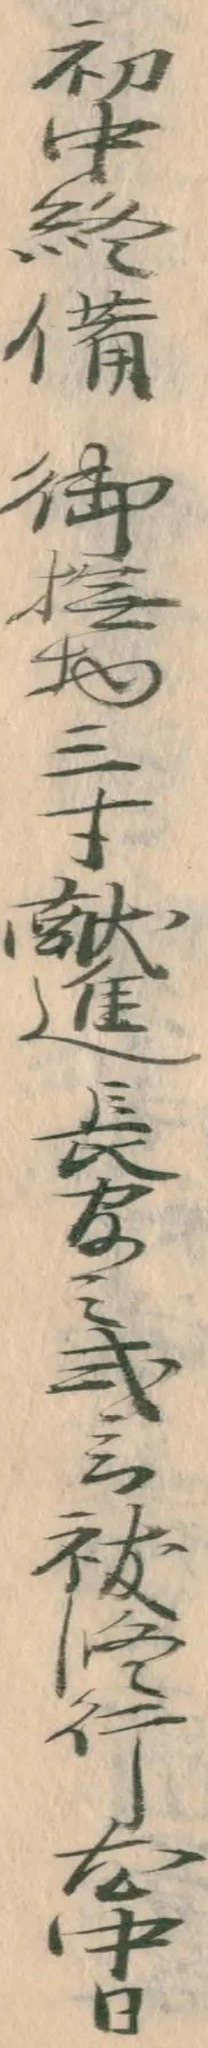初中終備御撫物三寸献進長官之式ニ而被修行尤中日
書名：賀茂社記録. 第74冊
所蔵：国立国会図書館 National Diet Library, JAPAN
